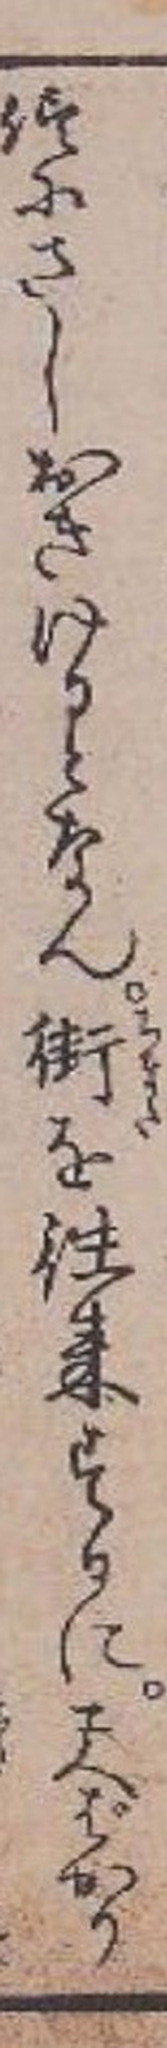儘にさしおきけるとなん、街を往来するに、尺ばかり
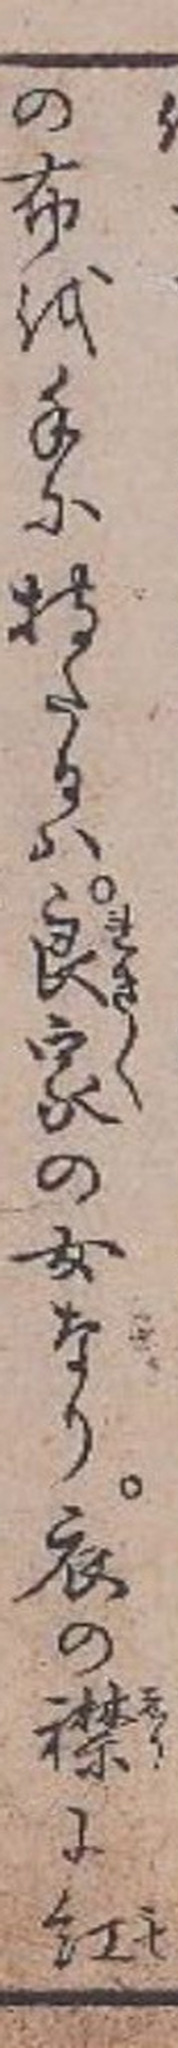の布を手に持たるは、良家の女なり、衣の襟に紅
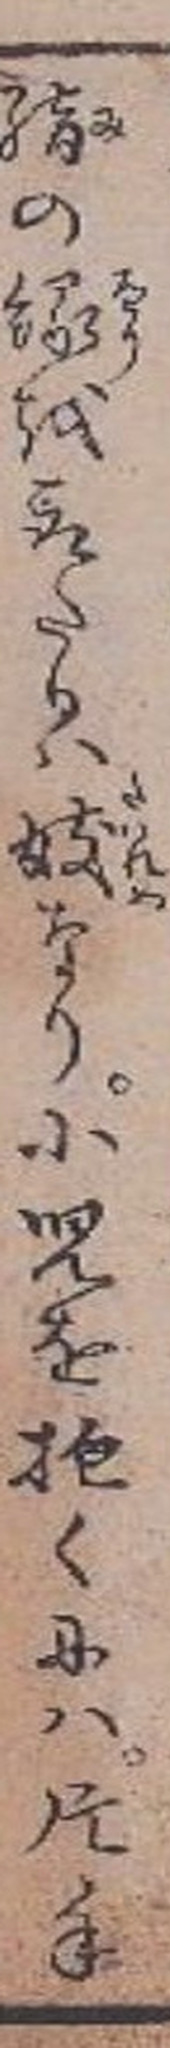絹の縁を取たるは妓なり、小児を抱くには、片手

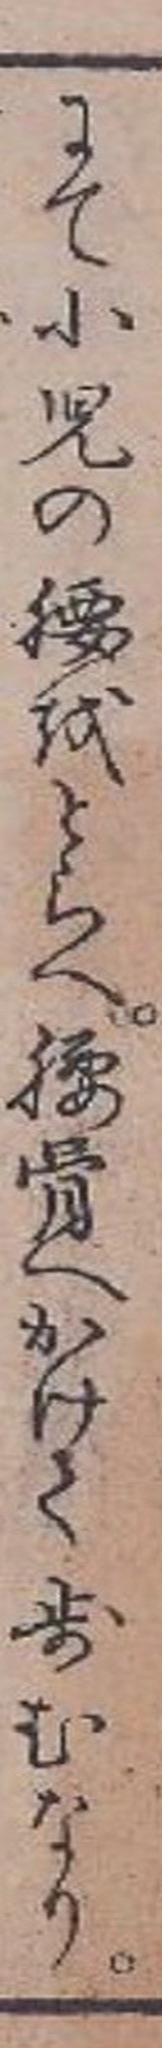にて小児の腰をとらへ、腰骨へかけて歩むなり、
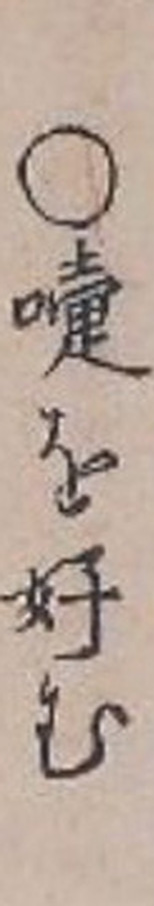〇嚏を好む
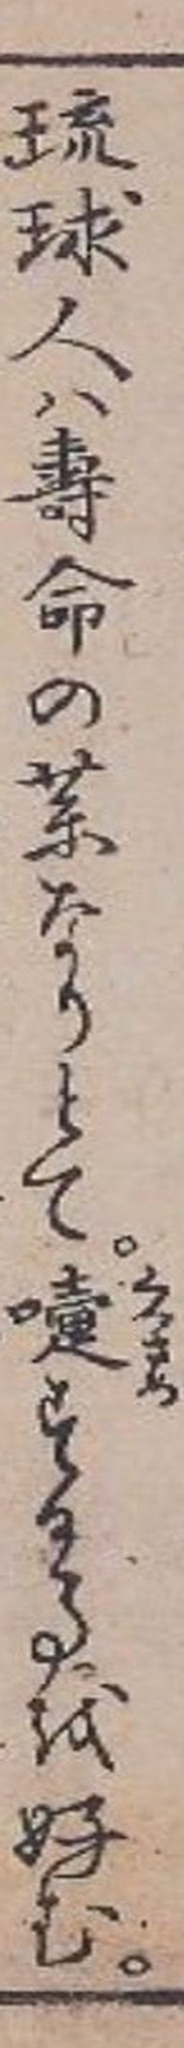琉球人は寿命の薬なりとて、嚏する事、を好む、
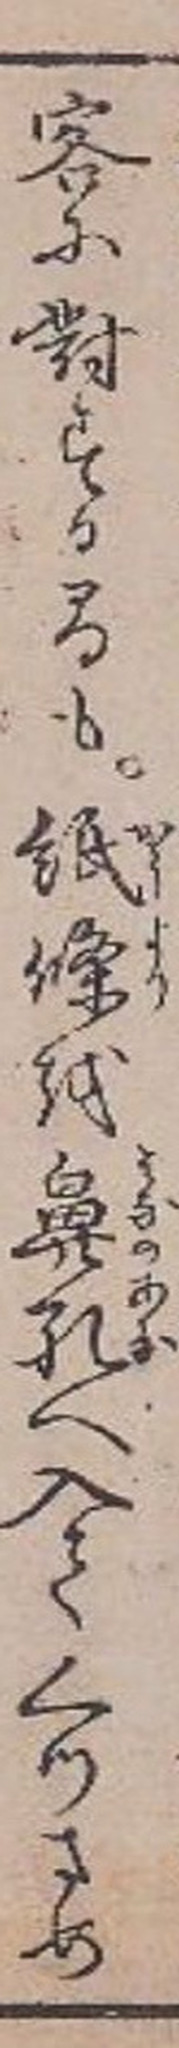客に対する間も、紙条を鼻孔へ入てくつさめ
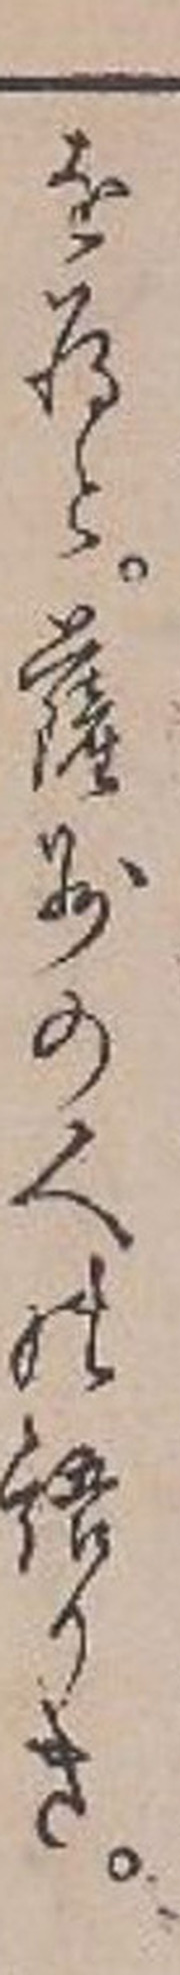を為と、薩州の人の語りき、
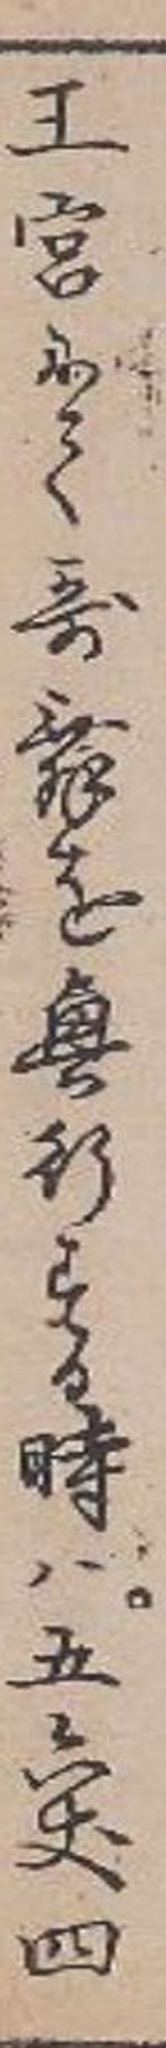王宮にて哥舞を興行する時は、五六丈四
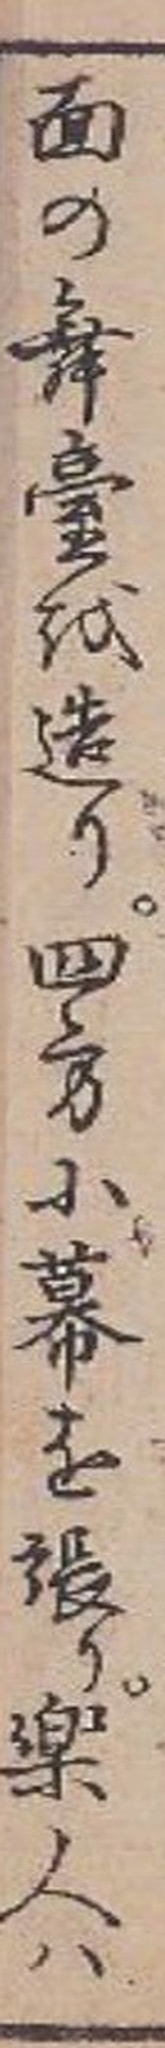面の舞台を造り、四方に幕を張り、楽人は
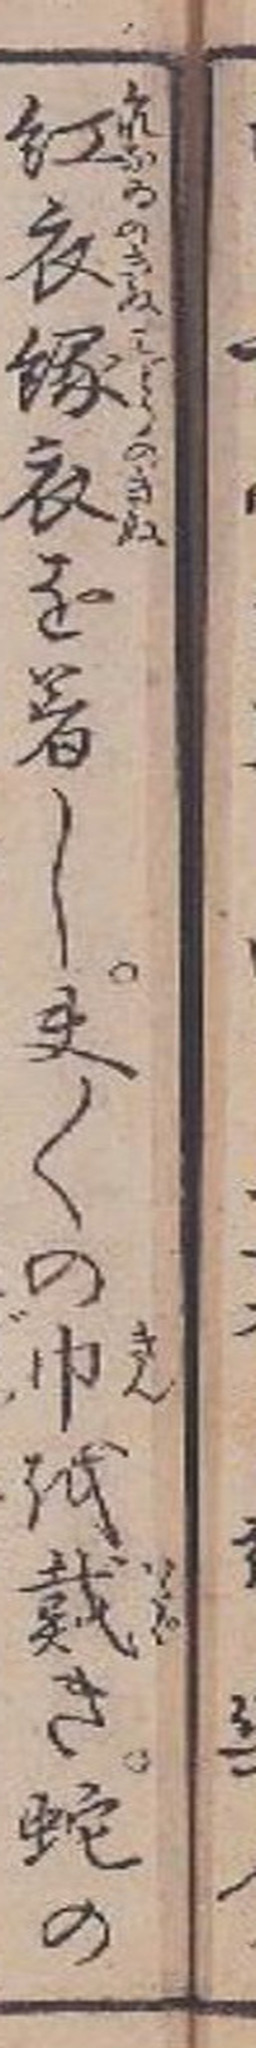紅衣緑衣を着し、夫〳〵の巾を戴き、蛇の
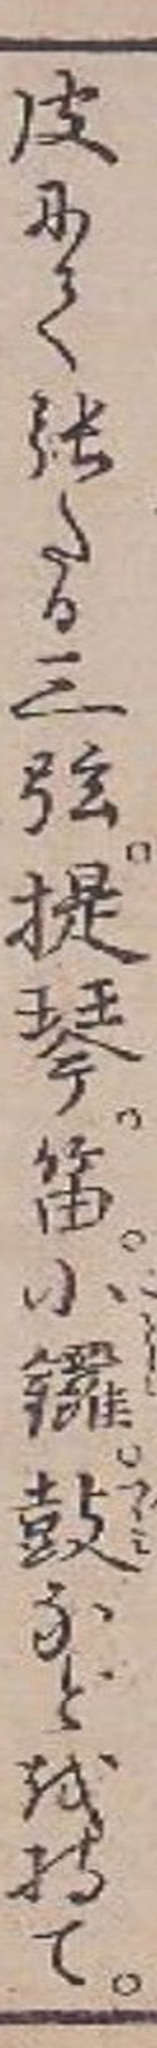皮にて張たる三弦、提琴、笛、小鑼、鼓などを持て、
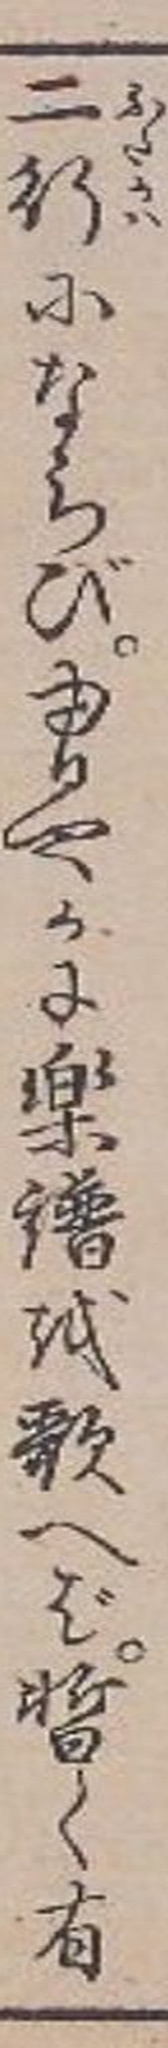二行にならび、ゆるやかに楽譜を歌へば、暫く有
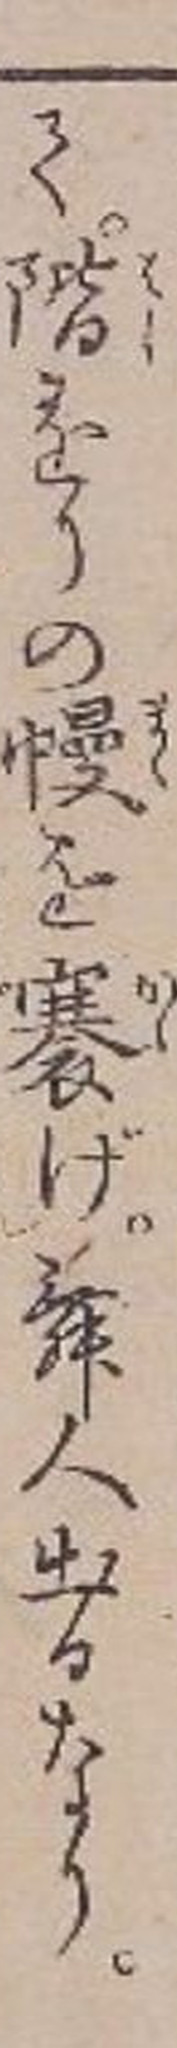て、階懸りの幔を褰げ、舞人出るなり、
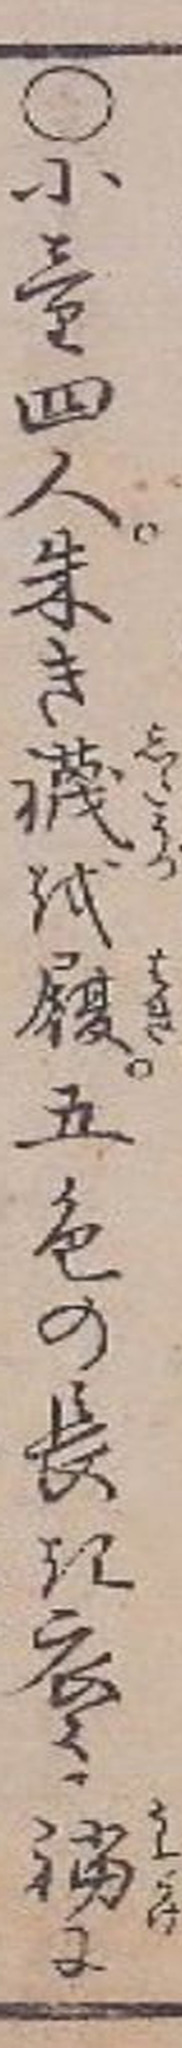〇小童四人、朱き襪を履、五色の長き衣を襠に
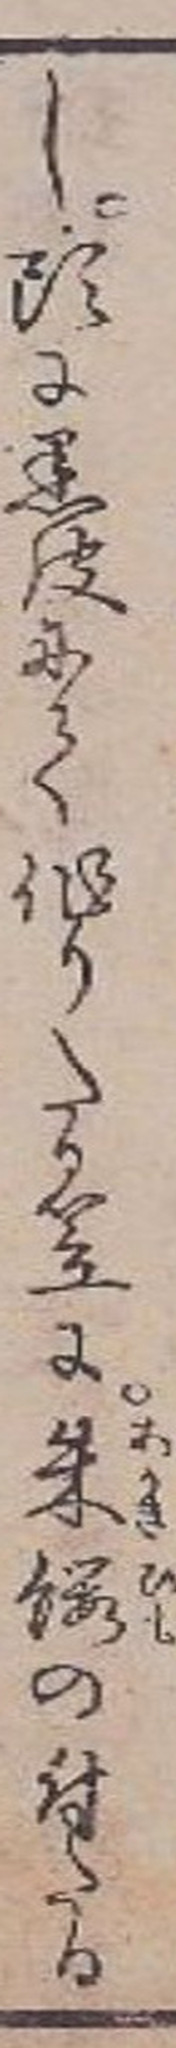し、頭に黒皮にて作りたる笠に、朱纓の付たる
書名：琉球談
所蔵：University of the Ryukyus Library
